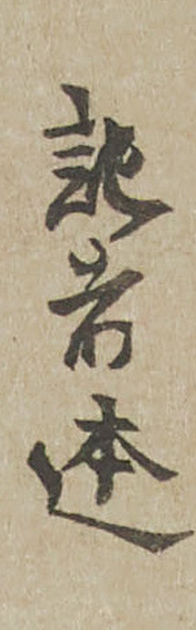記者述
